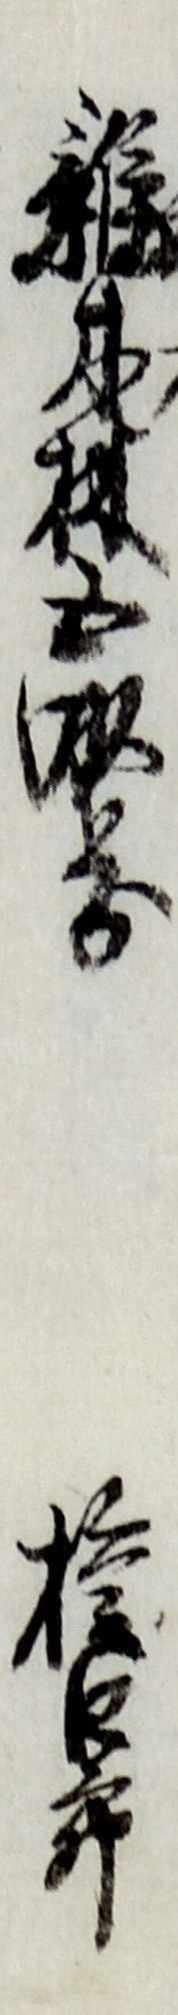雑木林五畝歩権四郎
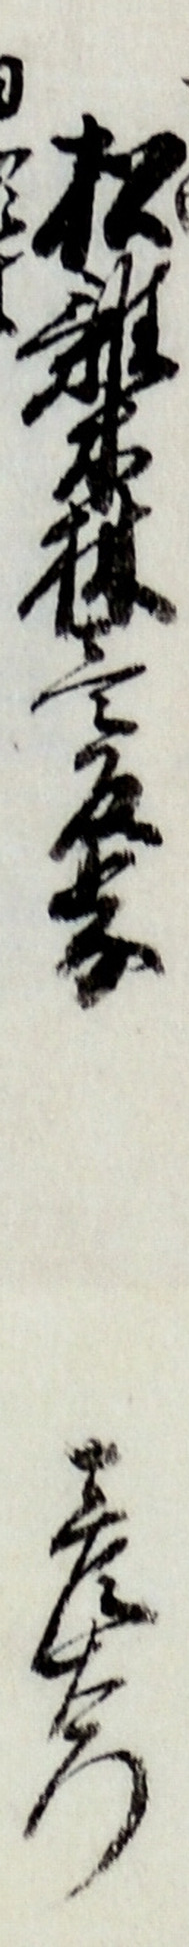松雑木林壱反歩彦右衛門
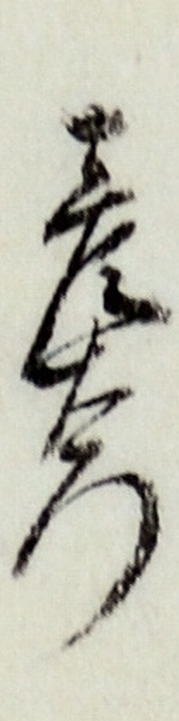兵右衛門
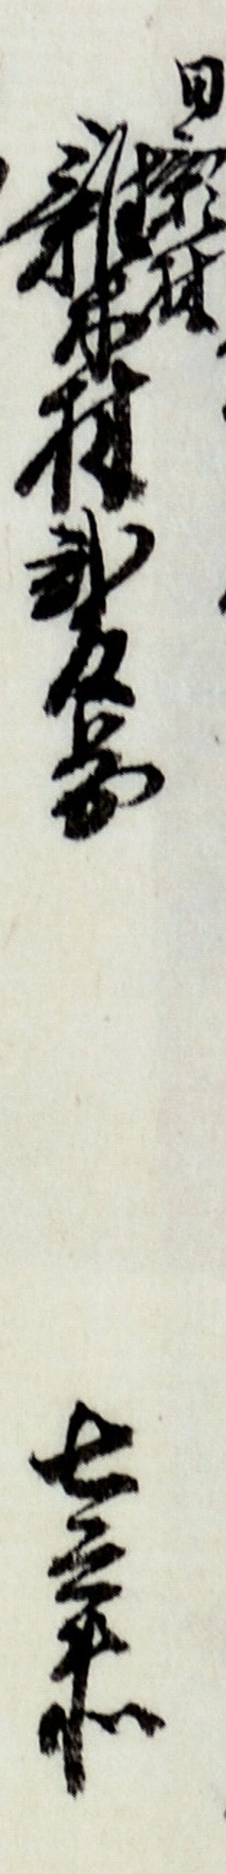雑木林弐反歩七兵衛
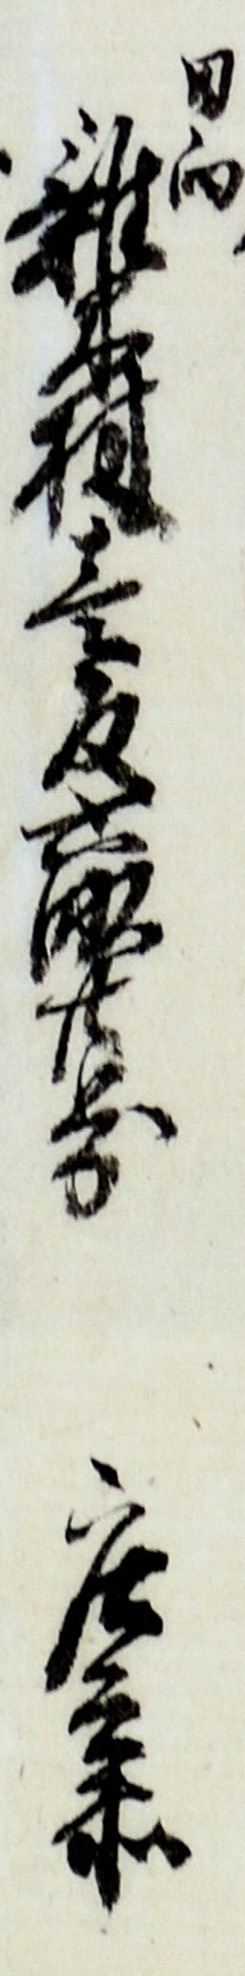雑木林壱反六畝廿歩庄兵衛
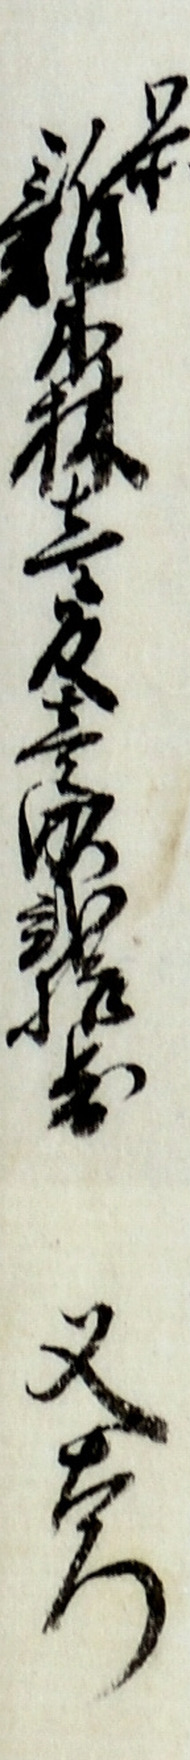雑木林壱反壱畝弐拾歩又右衛門
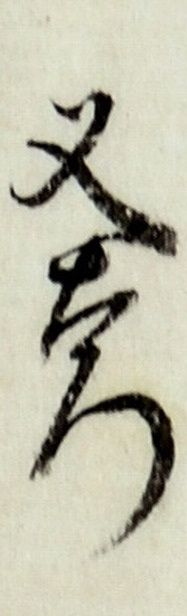兵右衛門
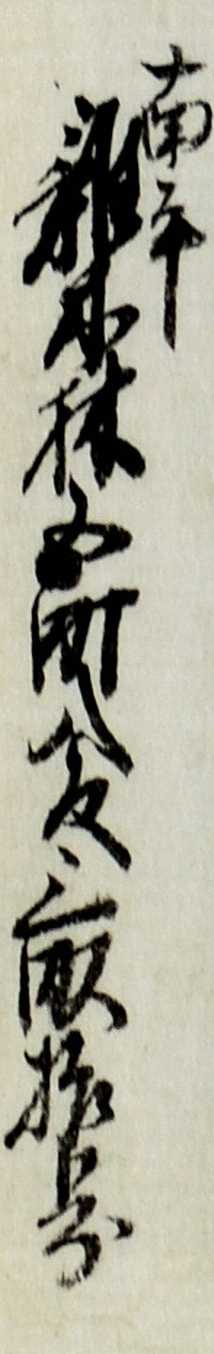雑木林五町八反三畝拾歩
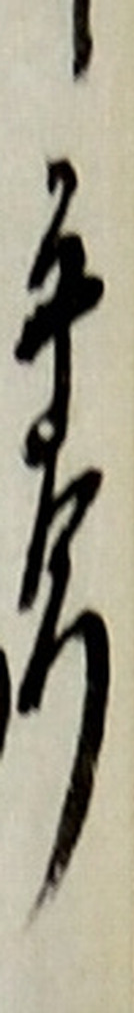兵右衛門
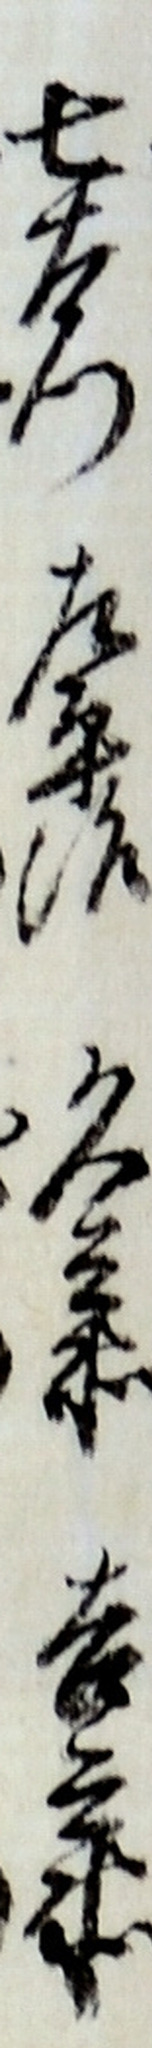七右衛門左平治久兵衛吉兵衛
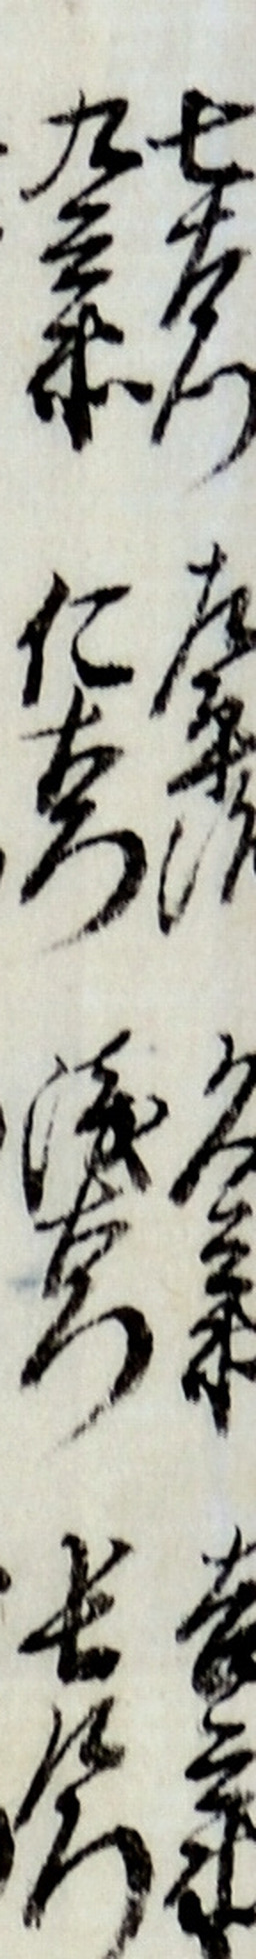九兵衛仁右衛門浅右衛門長左衛門
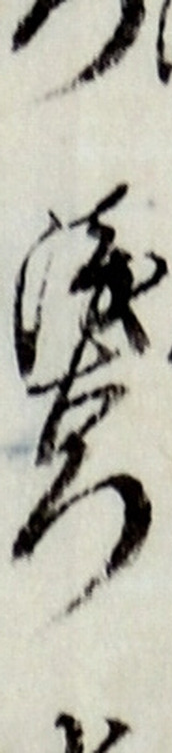兵右衛門
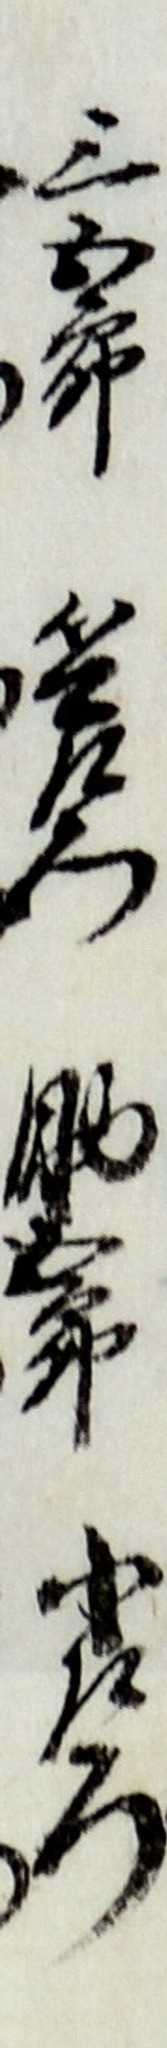三五郎兵左衛門助五郎小左衛門
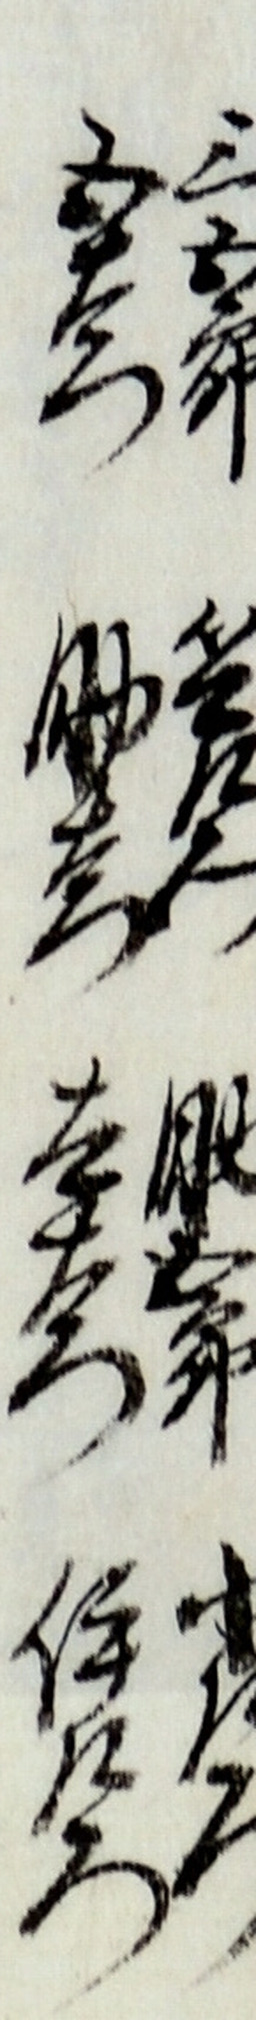五右衛門助右衛門太右衛門伊左衛門
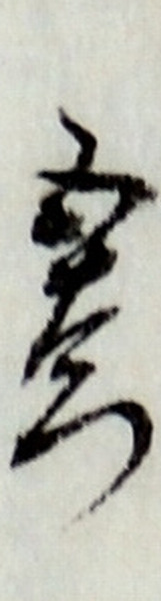兵右衛門
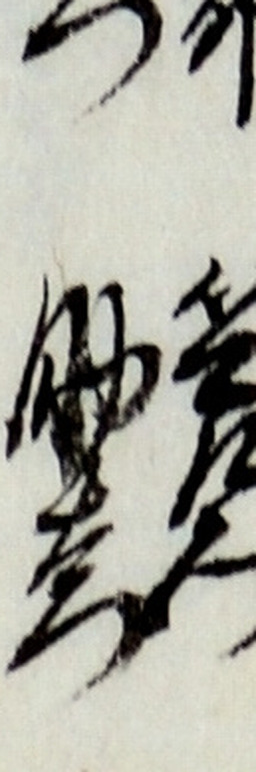兵右衛門
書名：御領分中山林社地手控
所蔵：伊那市立高遠町図書館・合同会社AMANE
